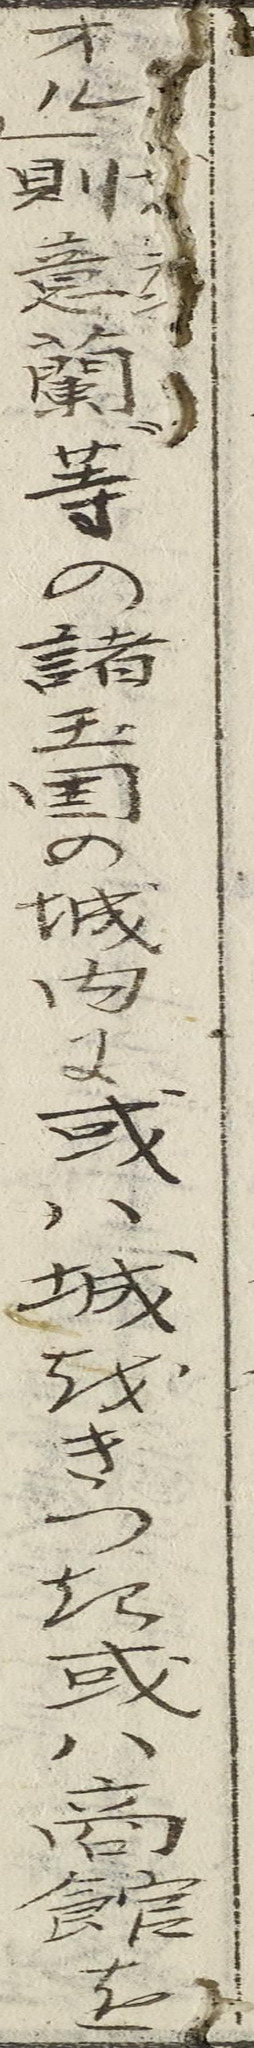オル」則意蘭、等の諸王国の城内に或ハ城をきつき或ハ商館を
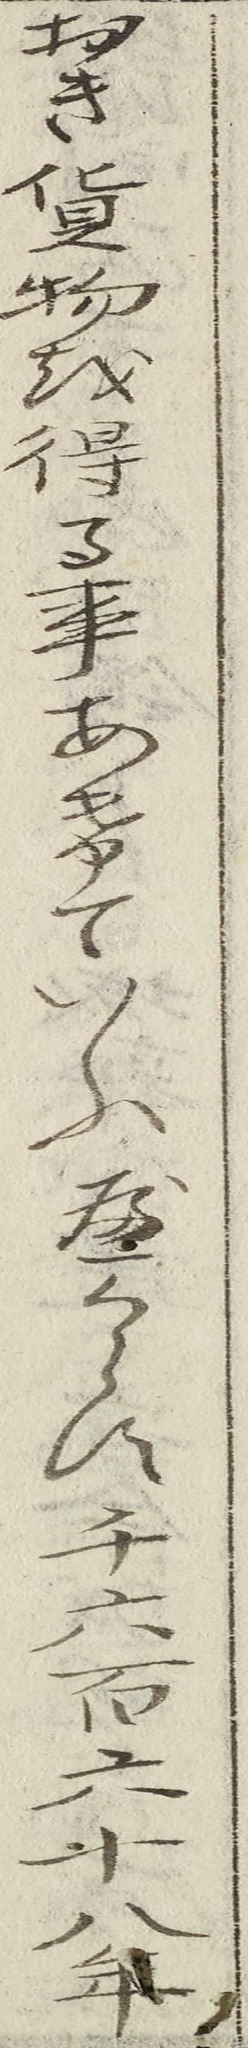おき貨物を得る事あけていふへからす千六百六十八年
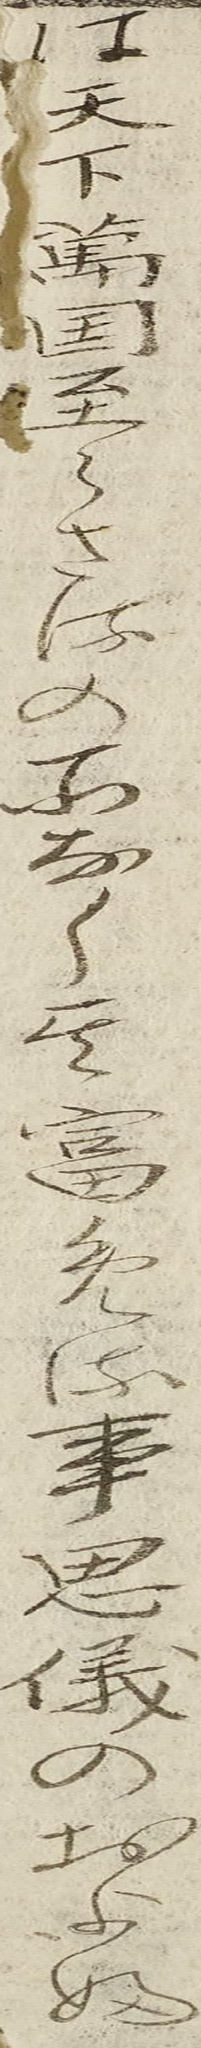は天下万国至らさるの所なく其富めること思儀のおよふ
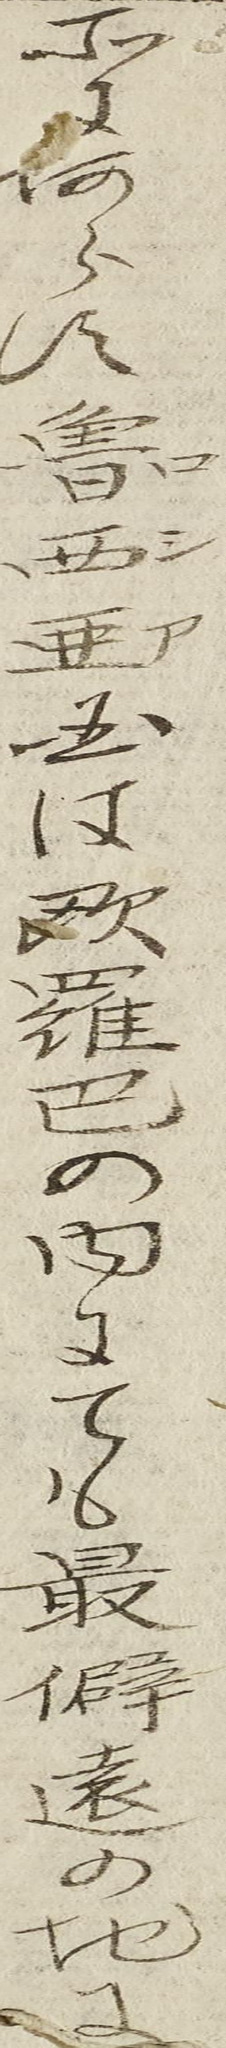所にあらす魯西亜国は欧羅巴の内にても最僻遠の地に
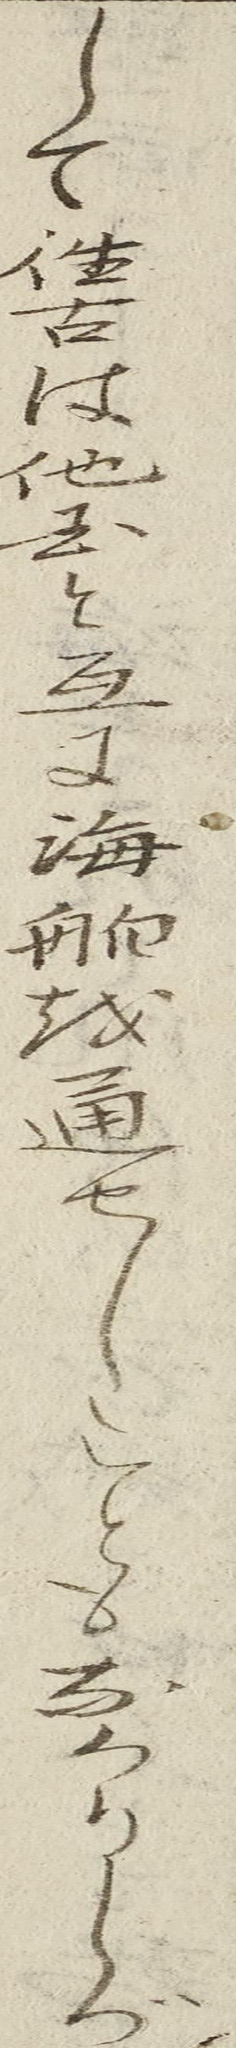して往古は多国と互に海舶を通せしこともなかりしが
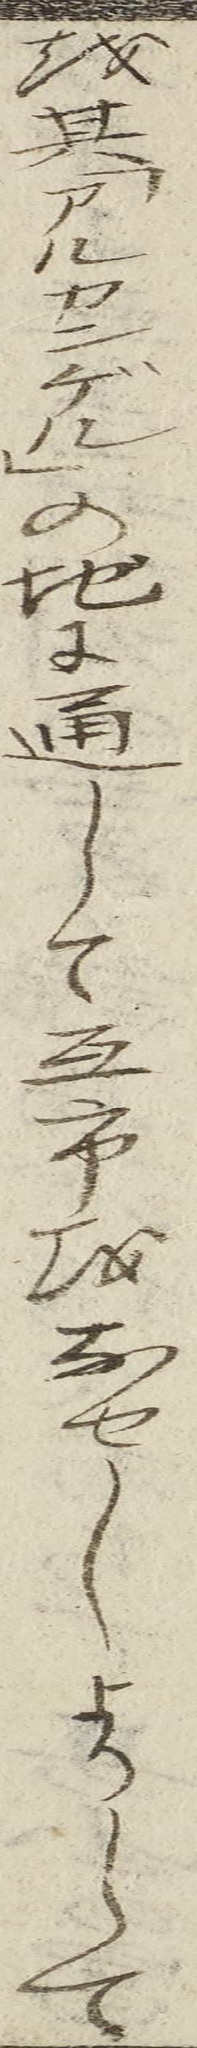を其「アルカンゲル」の地に通して互市をなせしよりして
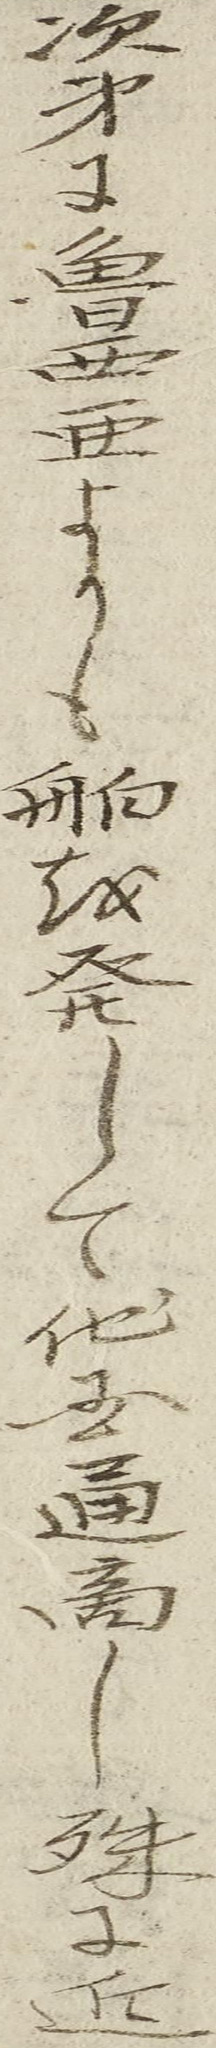次第に魯西亜よりも舶を発して他国通商し殊に近
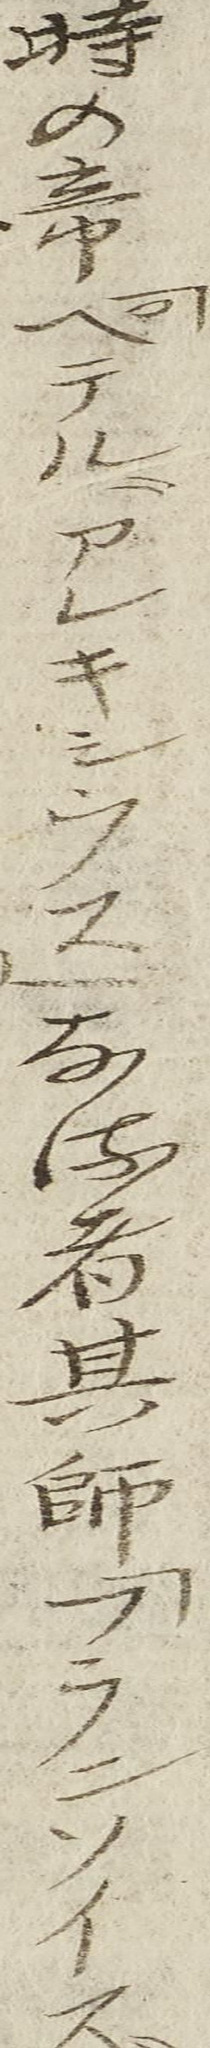時の帝「ぺテル。アレキシウス」なる者其師「フランソイス。と
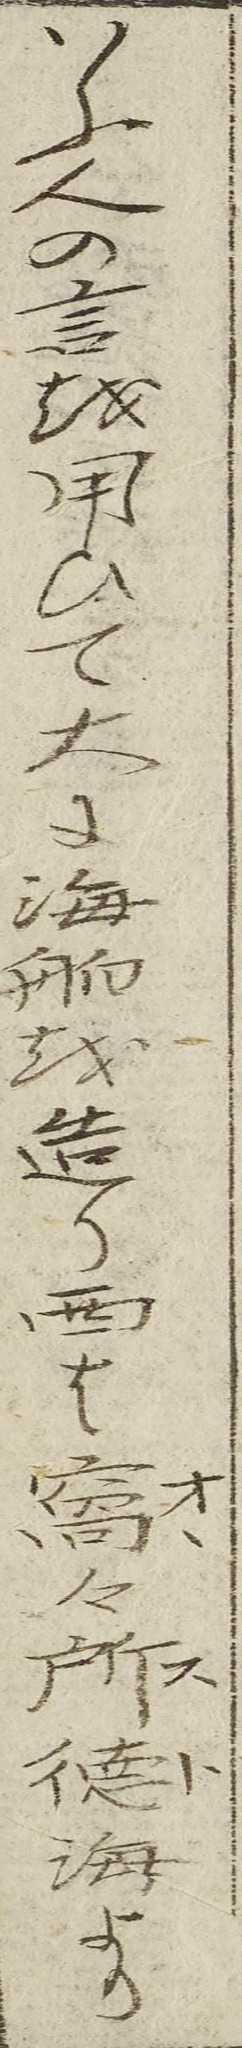いふ人の言を用ひて海舶造り西は窩々所徳海より

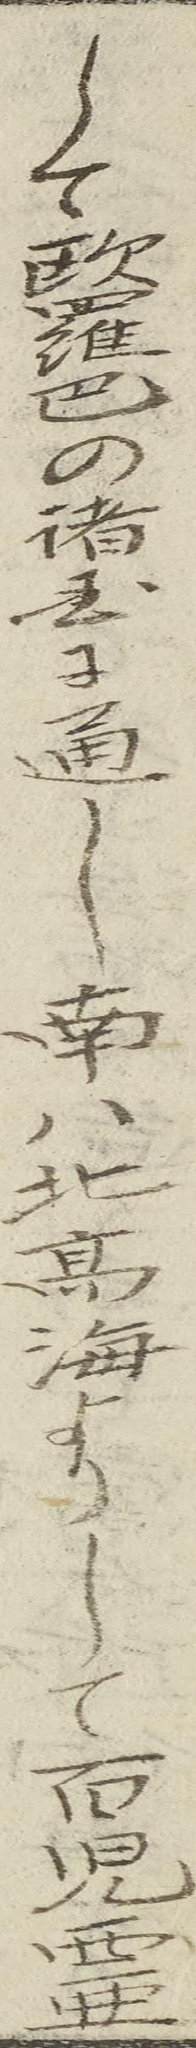して欧羅巴の諸国に通し南ハ北高海よりして百児西亜
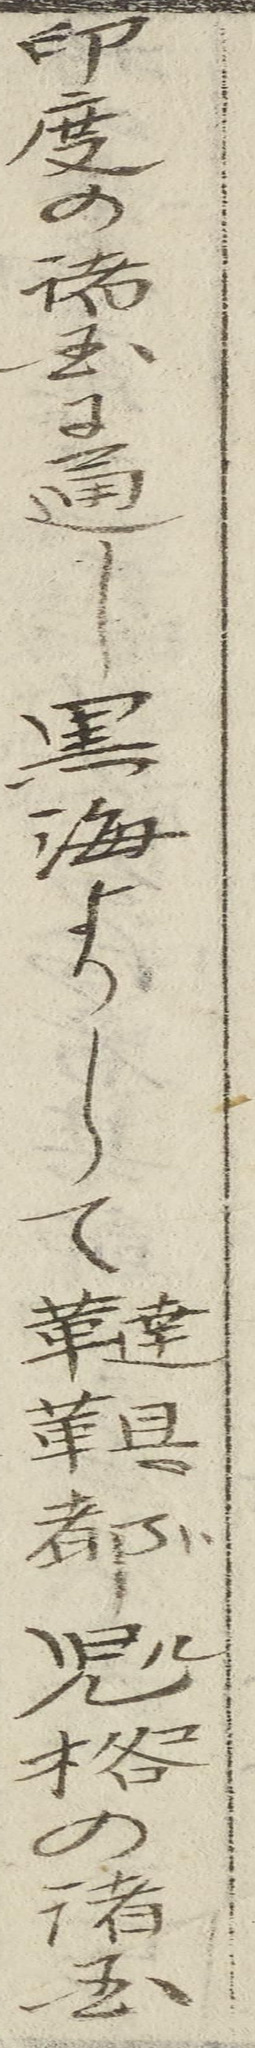印度の諸国に通し黒海よりして韃靼。都児挌の諸国
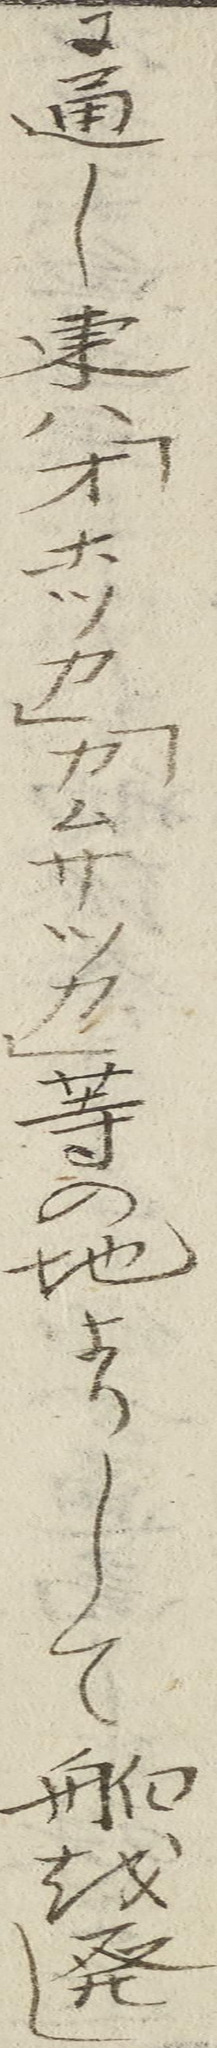に通し東ハ「オホツカ」カムサツカ」等の地よりして舶を発し
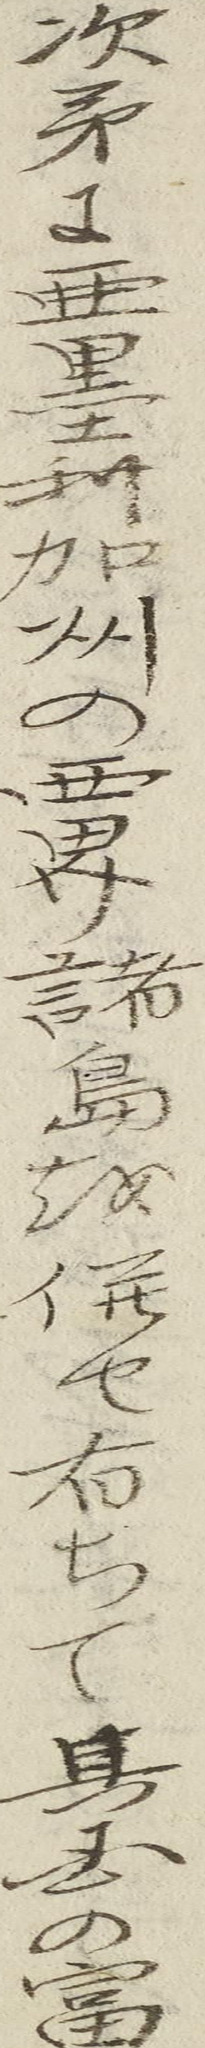次第に亜墨利加州の西界諸島を併せ有ちて其国の富
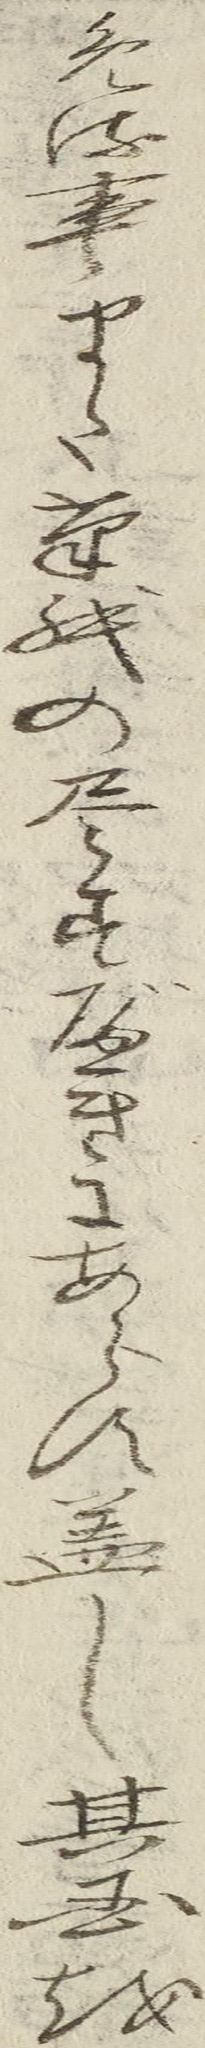める事また筆紙の尽すべきにあらす蓋し其国を
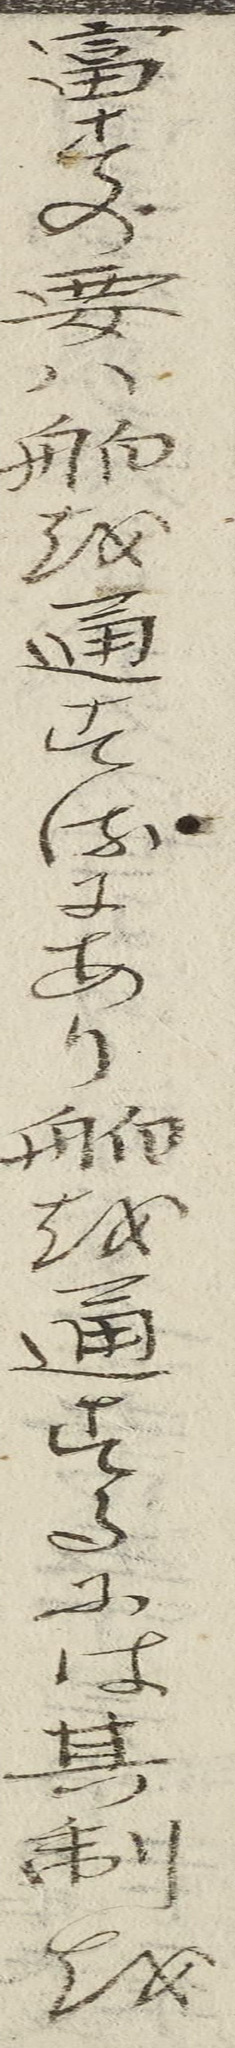富すの要ハ舶を通するにあり舶を通するには其制を
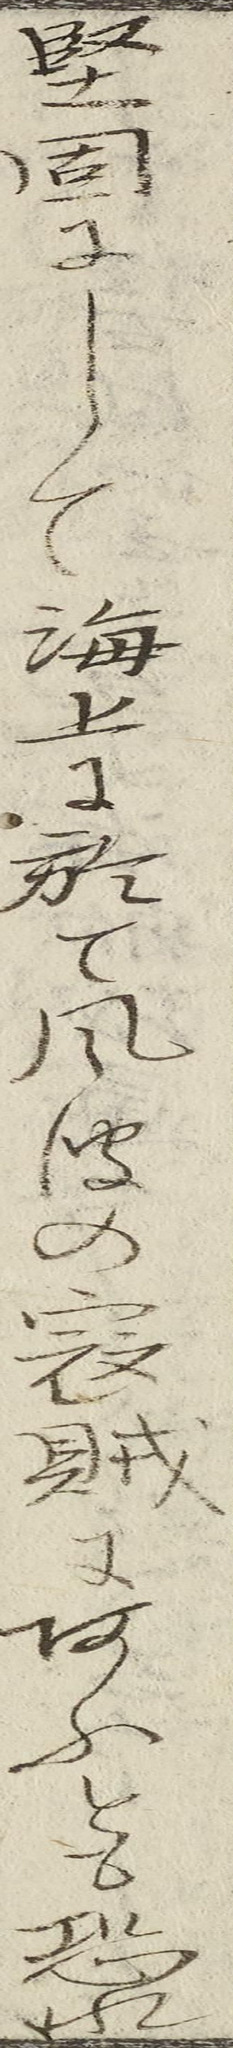堅固にして海上に於て風波の寰賊にあふとも恐れ
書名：西洋雜記　乾
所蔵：東京大学地震研究所図書室 Earthquake Research Institute Library, The University of Tokyo, JAPAN
